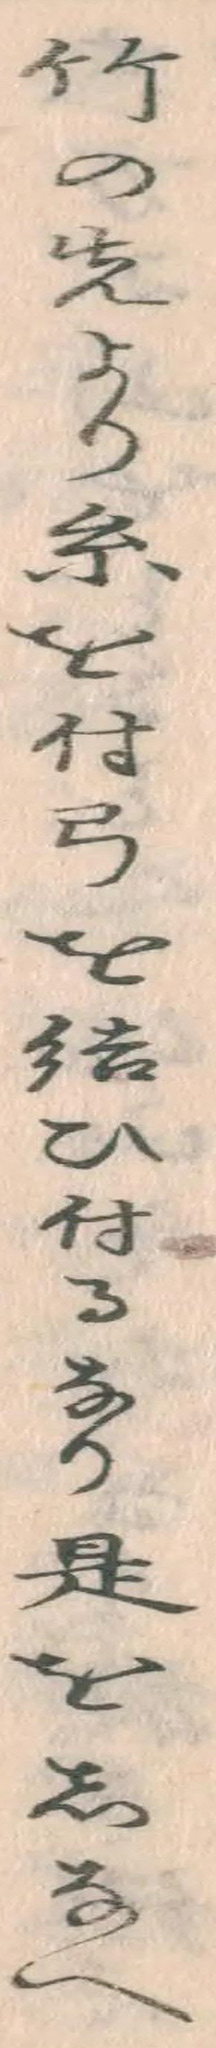竹の先より糸を付弓を結ひ付るなり是をしなへ
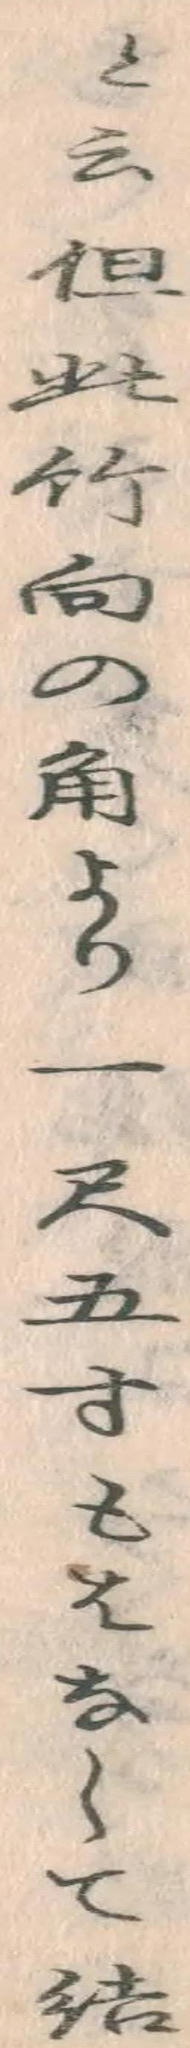と云但此竹向の角より一尺五寸もはなして結
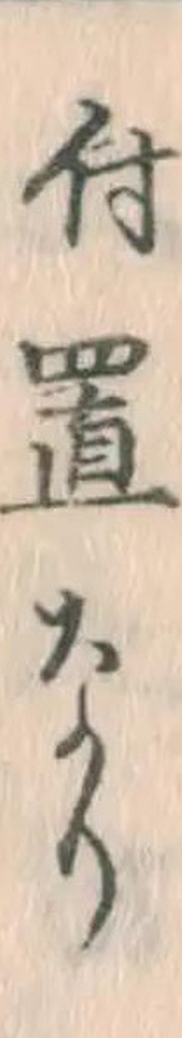付置なり
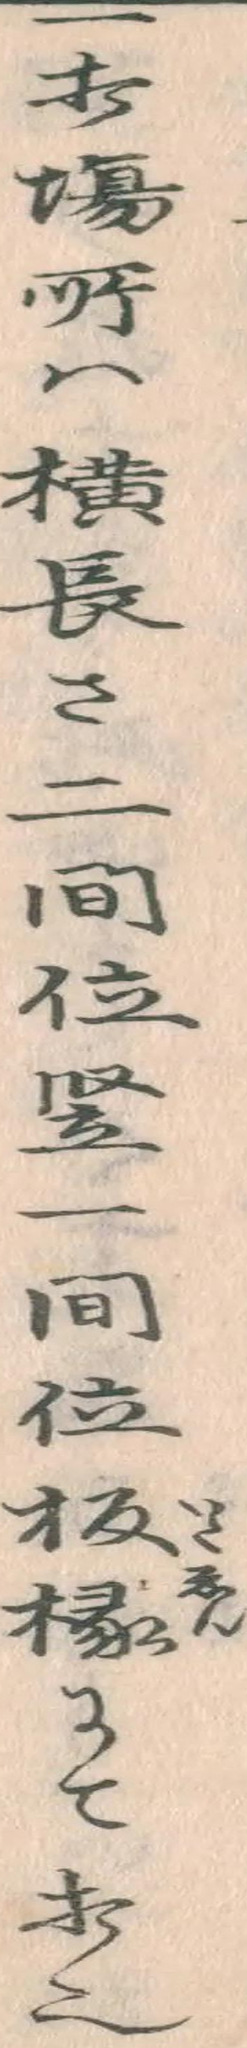一打場所は横長さ二間位竪一間位板椽にて打也
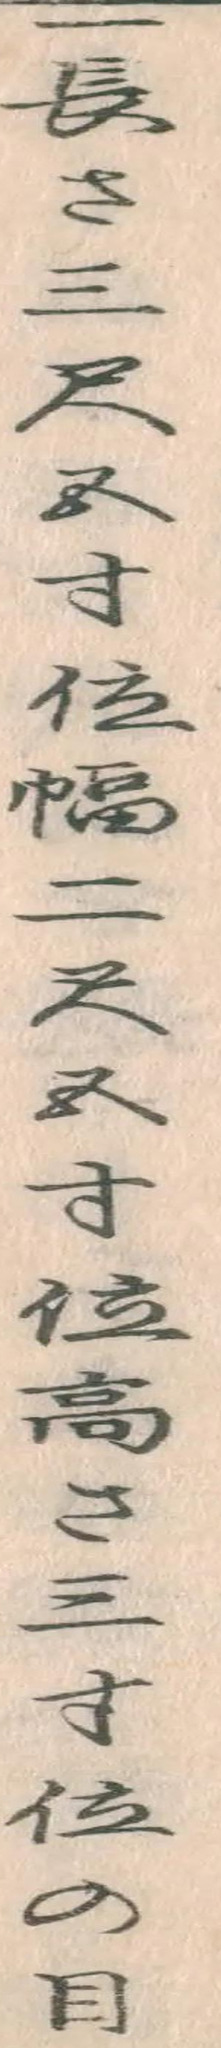一長さ三尺五寸位幅二尺五寸位高さ三寸位の目
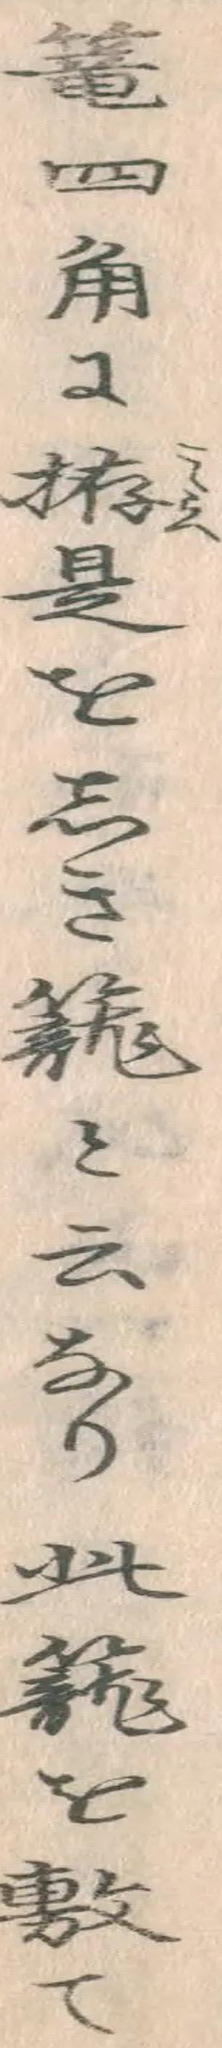籠四角に拵是をしき籠と云なり此籠を敷て
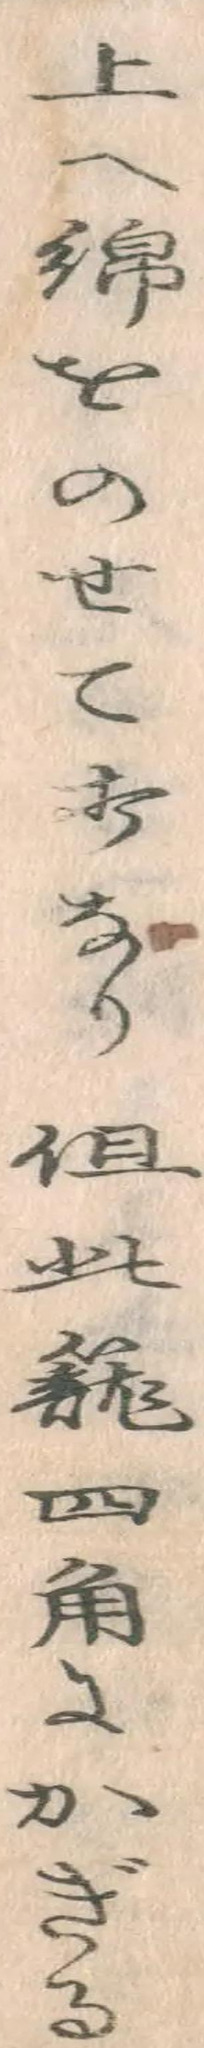上へ綿をのせて打なり但此籠四角にかぎる
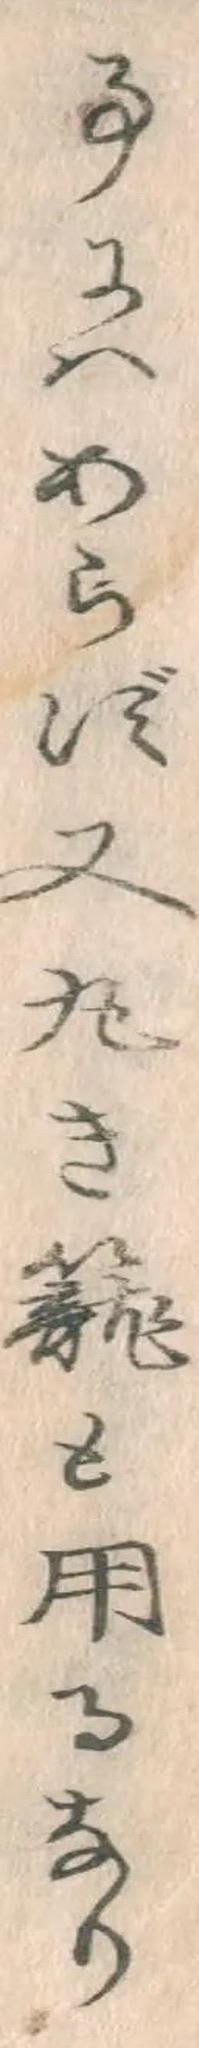事にはあらず又丸き籠も用るなり
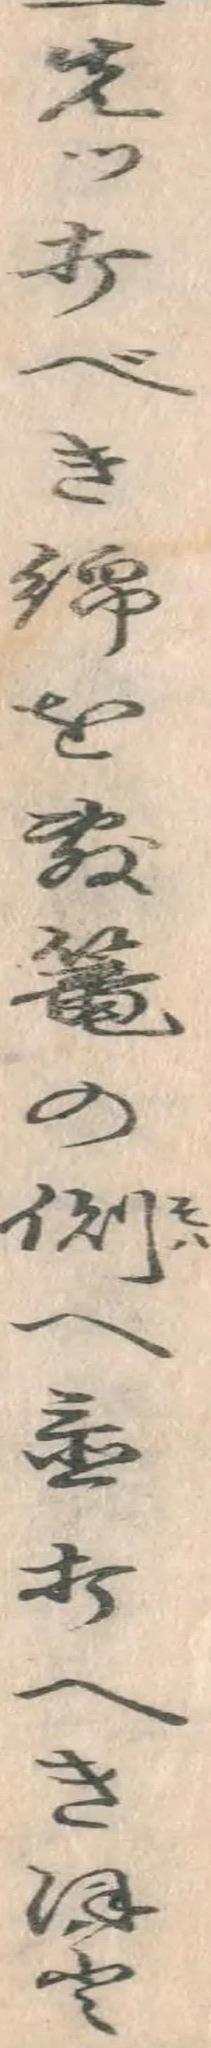一先つ打べき綿を敷籠の側へ置打へきほと
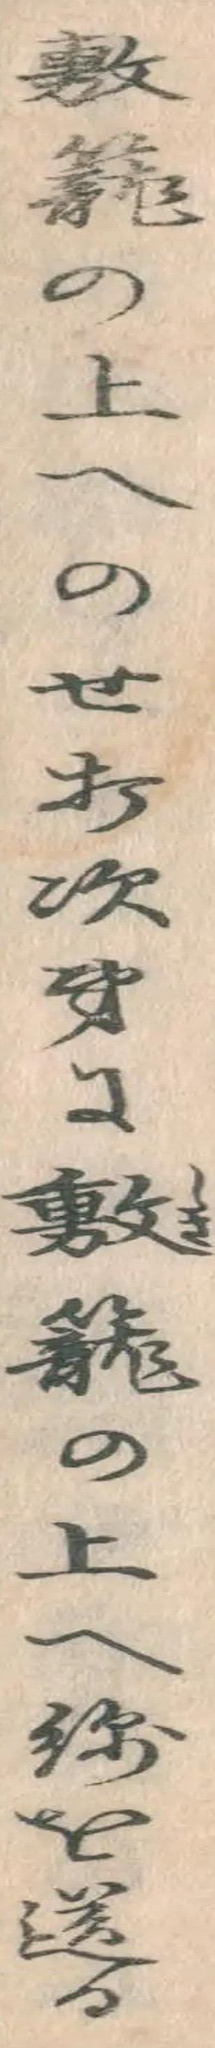敷籠の上へのせ打次第に敷籠の上へ綿を送る

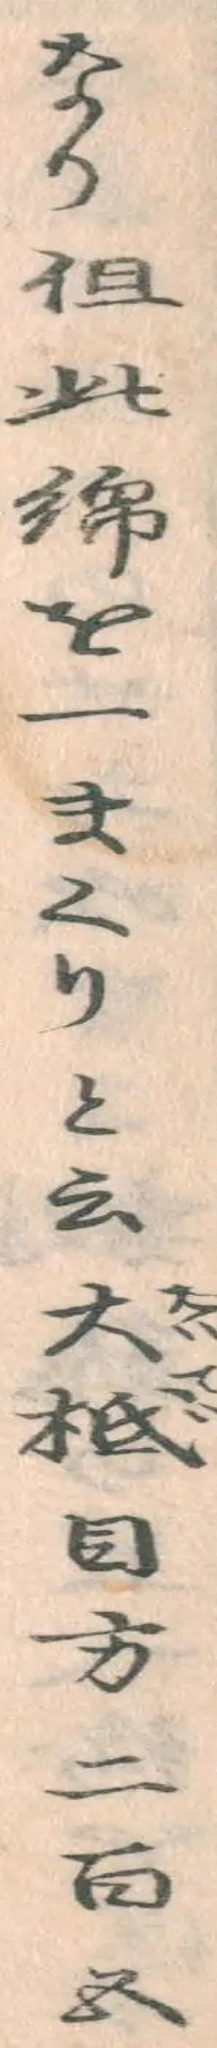なり但此綿を一まくりと云大抵目方二百五
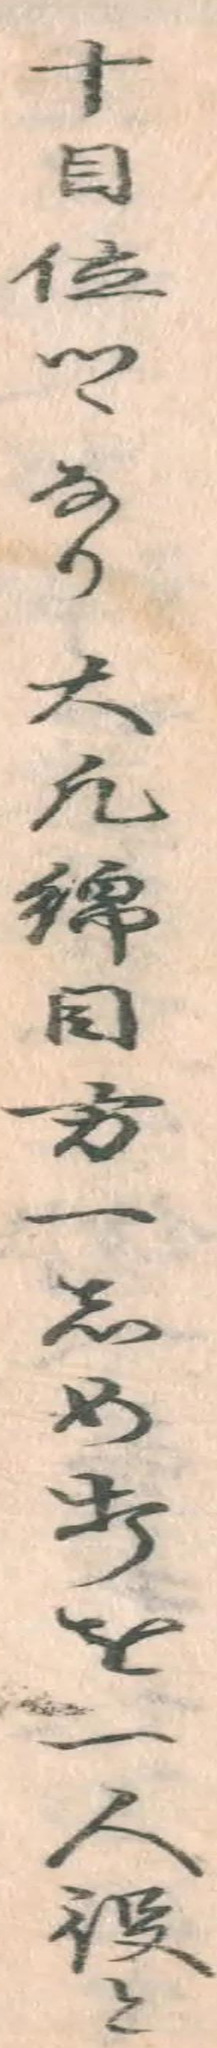十目位つゝなり大凡綿目方一しめ打を一人役と
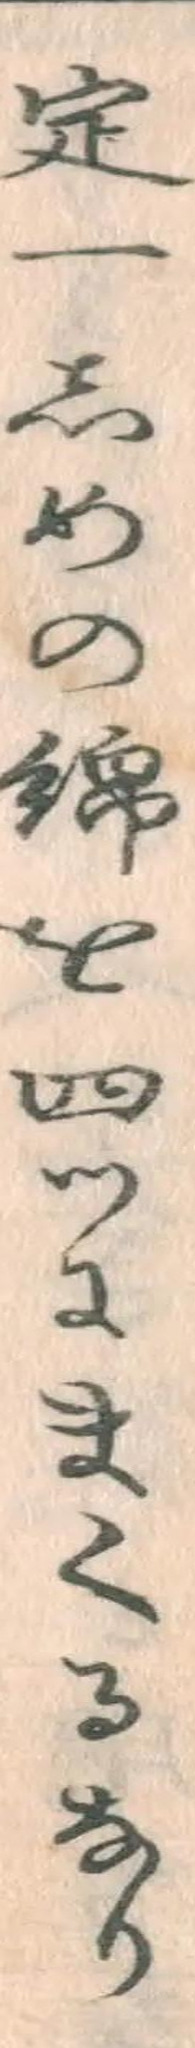定一しめの綿を四ッにまくるなり
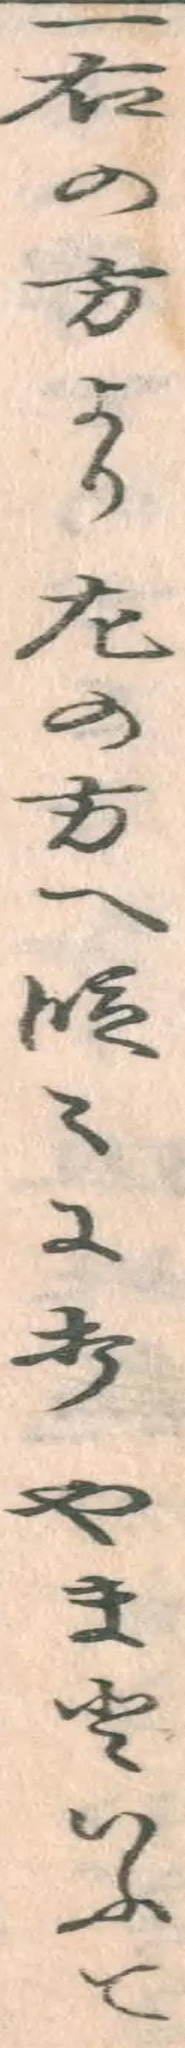一右の方より左の方へ段々に打やまといふて
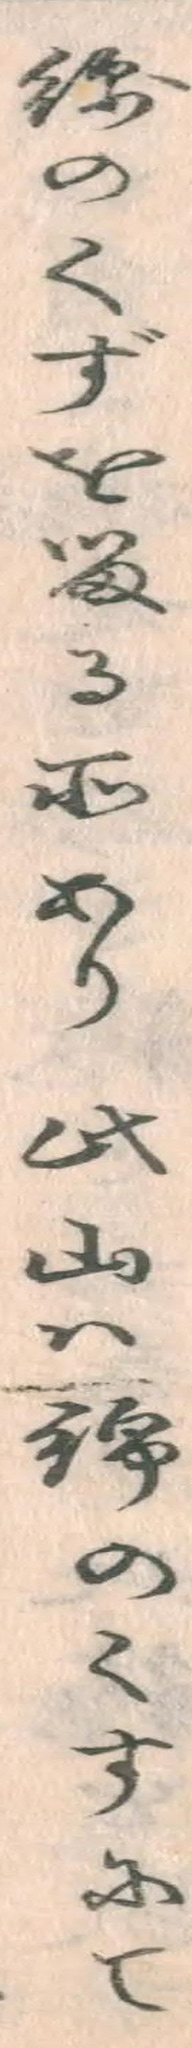綿のくずを留る所あり此山は綿のくすにて
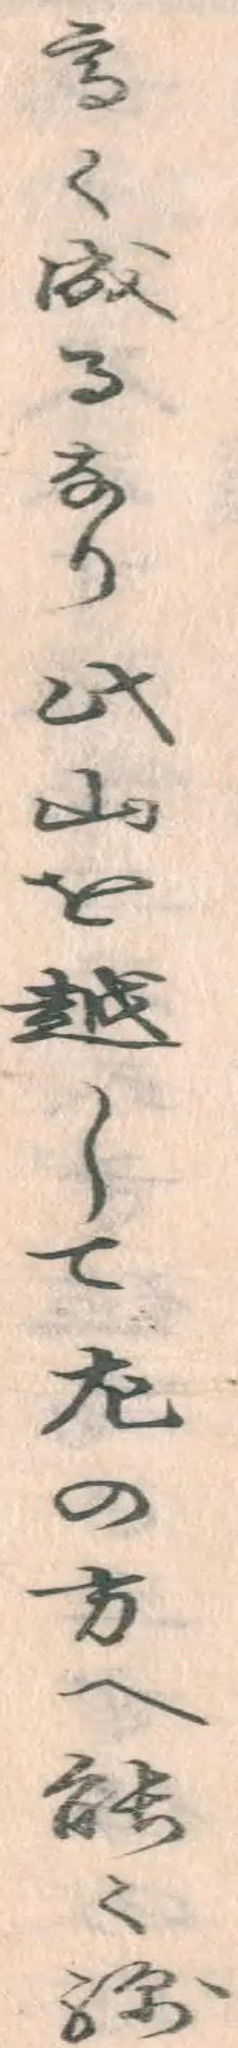高く成るなり此山を越して左の方へ能く綿
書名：機織彙編 5巻. [1]
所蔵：国立国会図書館 National Diet Library, JAPAN
